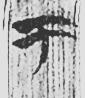于
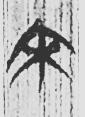宋
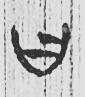曰
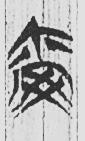爾
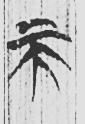天
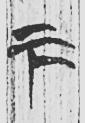下
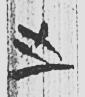之
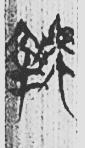{幸虎}
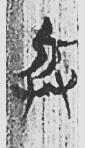兵
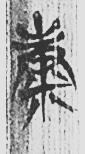康
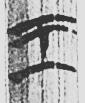王
